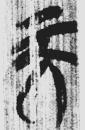天
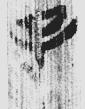子
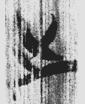之
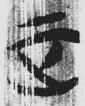正
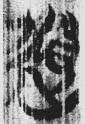道
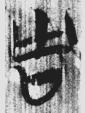周
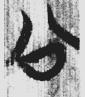公
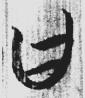曰
